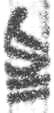爲
